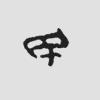民
